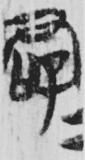君子
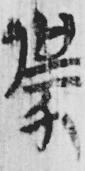勥（強）
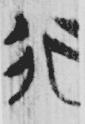行
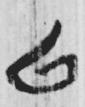㠯（以）
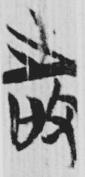○（待）
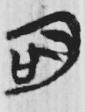名
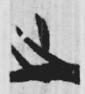之
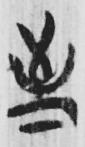至
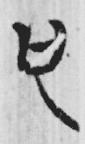也
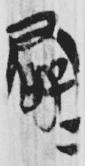君子
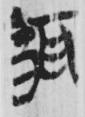○（聞）
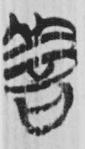善
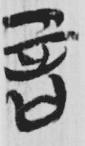言
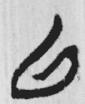㠯（以）
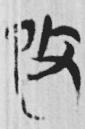改
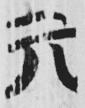亓（其）
